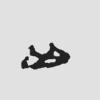凶
